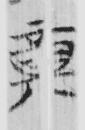奠
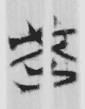武
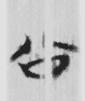公
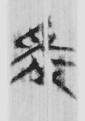卒B
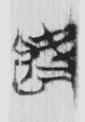既
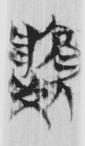{爿兔死}
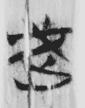武
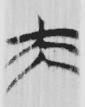夫
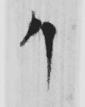人
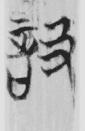{言？又}
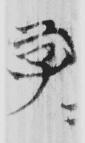乳=
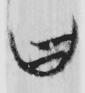曰
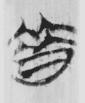昔
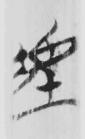𫊟
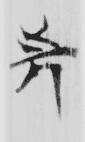先
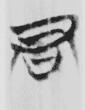君
